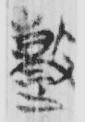{東攴正}
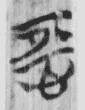{二外心}
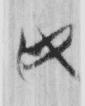女
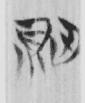則
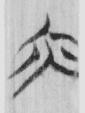亦
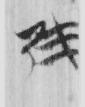隹
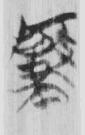肇
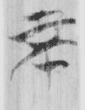不
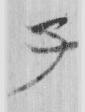子
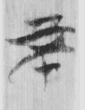不
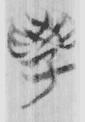學
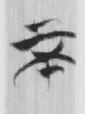不
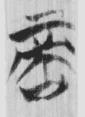啻
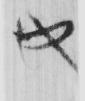女
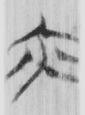亦
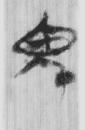鬼
